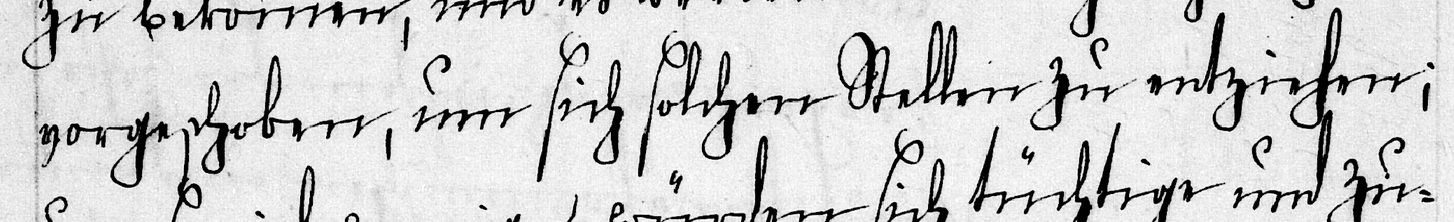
vorgeschoben, um sich solchen Stellen zu entziehen;
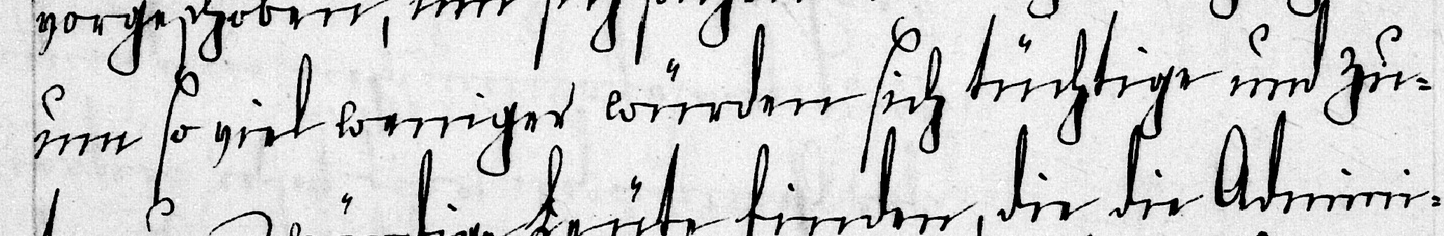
um so viel weniger würden sich tüchtige und zu¬
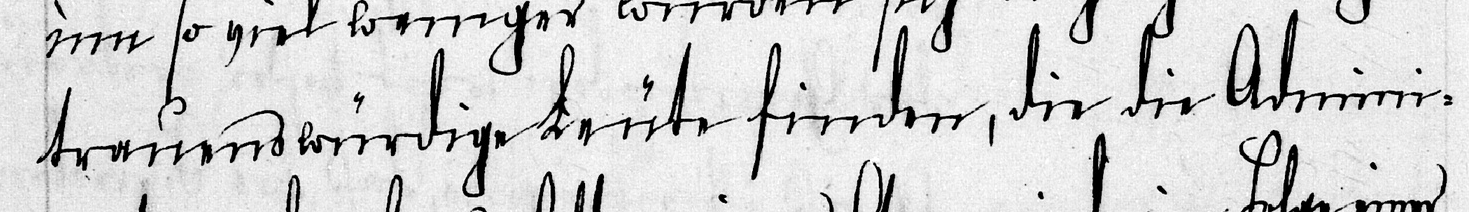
trauenswürdige Leute finden, die die Admini¬
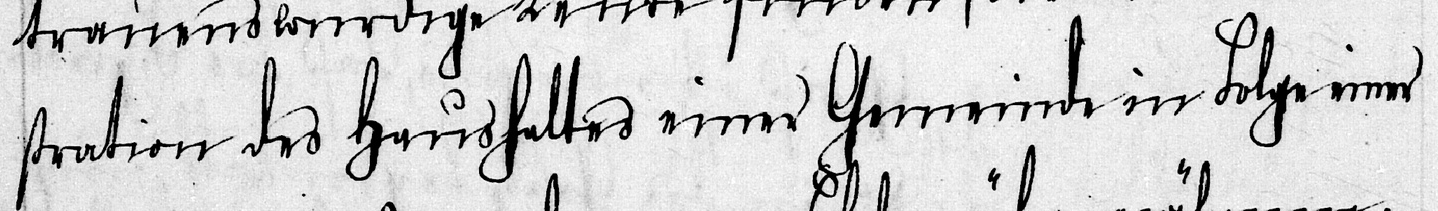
stration des Haushaltes einer Gemeinde in Folge einer
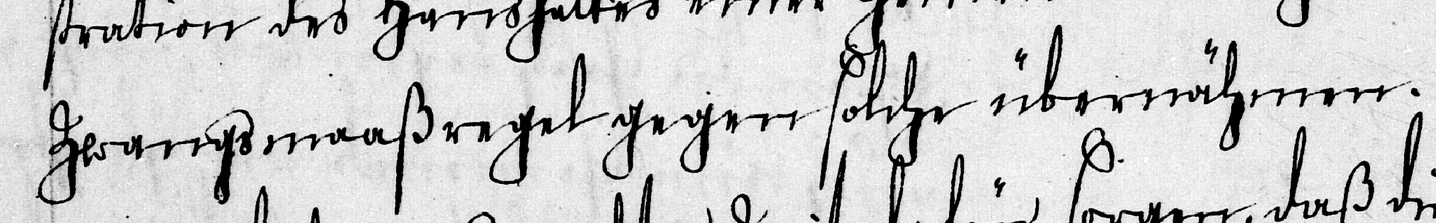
Zwangsmaaßregel gegen solche übernähmen.
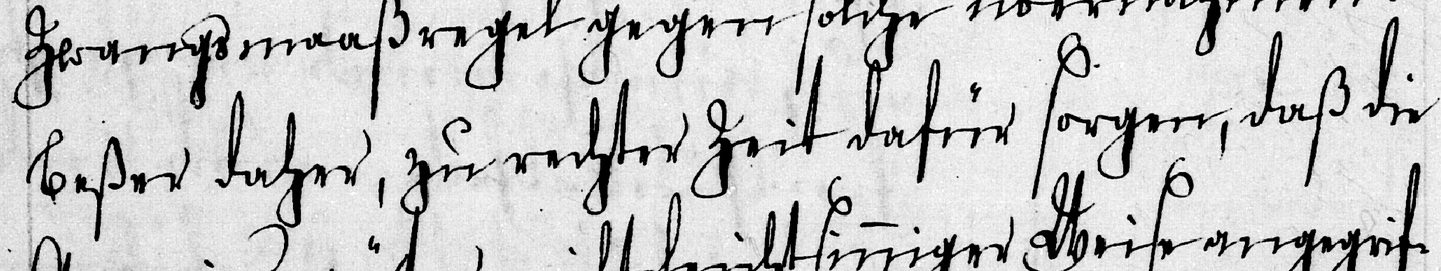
Beßer daher, zu rechter Zeit dafür sorgen, daß die
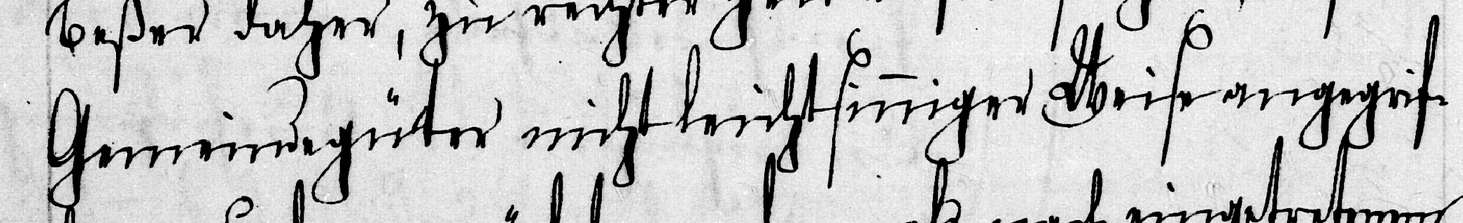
Gemeindegüter nicht leichtsinniger Weise angegrif¬
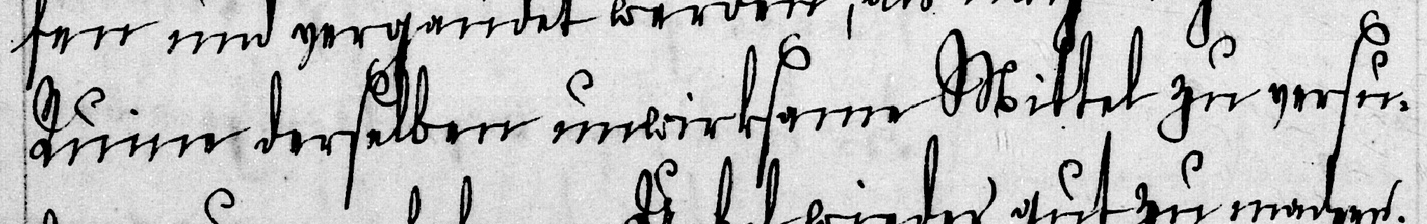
Ruine derselben unwirksame Mittel zu versu¬
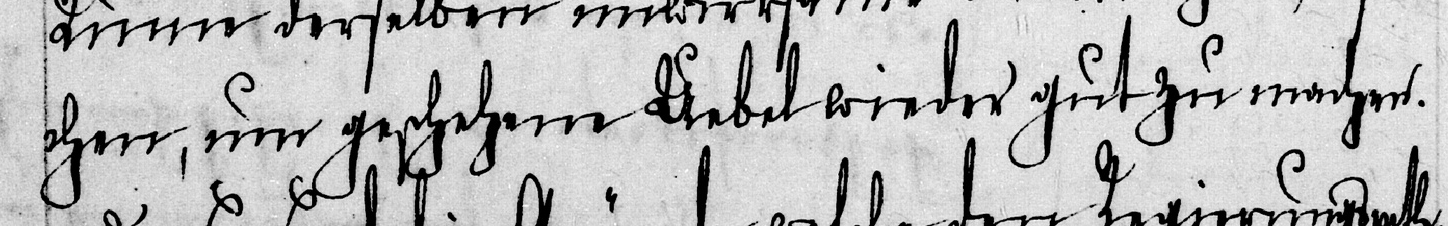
chen, um geschehene Uebel wieder gut zu machen.
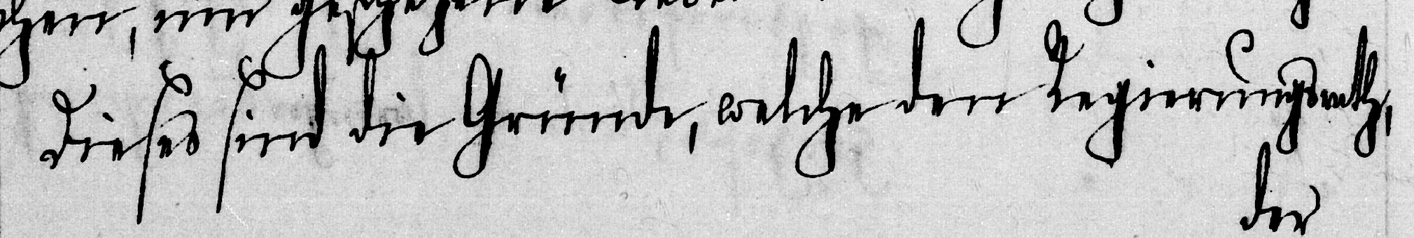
Dieses sind die Gründe, welche den Regierungsrath,
